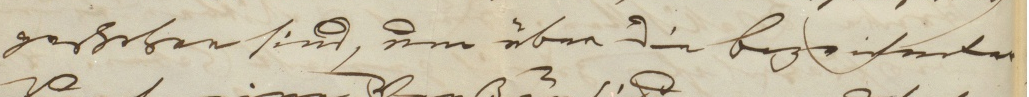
geschehen sind, um über die bezeichneten
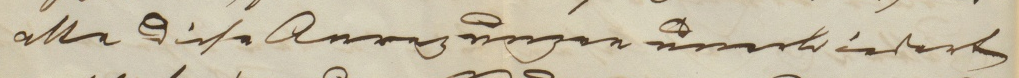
alle diese Anregungen unerwiedert
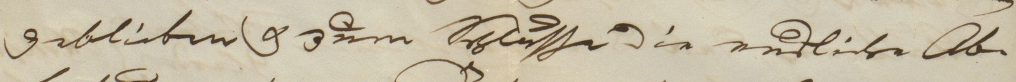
geblieben & zum Schlusse die endliche Ab-
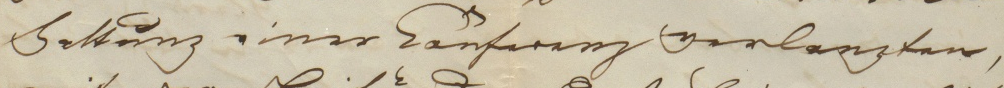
haltung einer Conferenz verlangten,
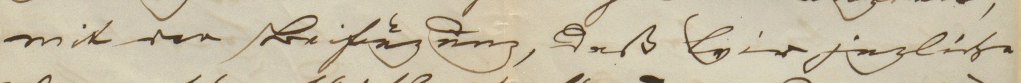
mit der Beifügung, daß wir jegliche
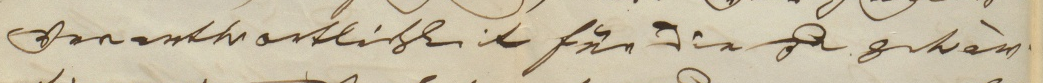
Verantwortlichkeit für die zu gewär-
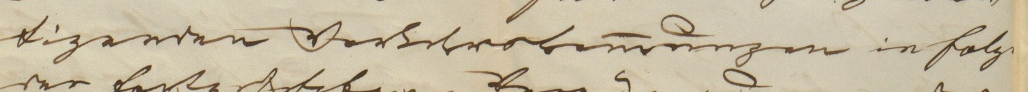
tigenden Verkehrshemmungen in Folge
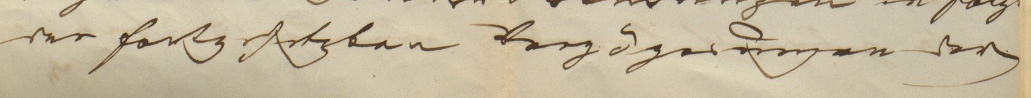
der fortgesetzten Verzögerungen der
